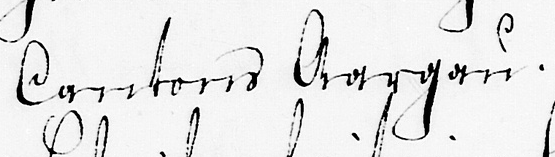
Cantons Aargau.
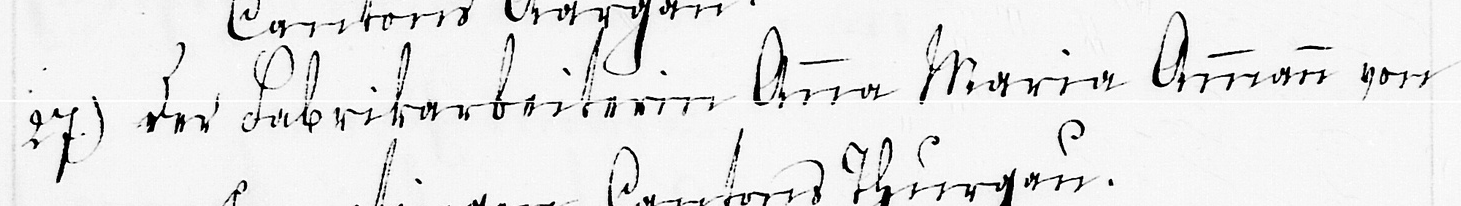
27.) Der Fabrikarbeiterin Anna Maria Ammann von
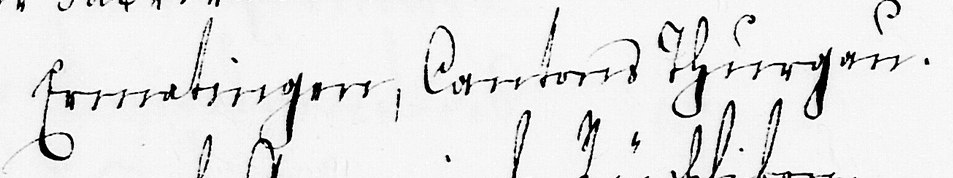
Ermatingen, Cantons Thurgau.
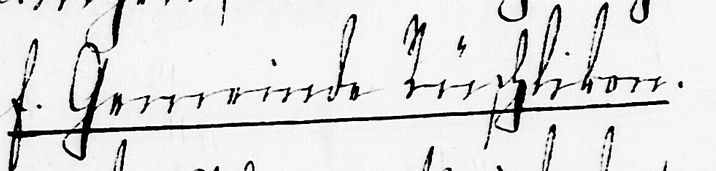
f. Gemeinde Rüschlikon.
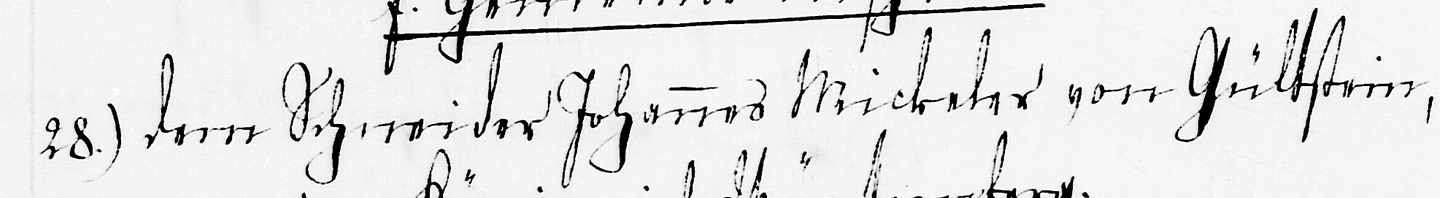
28.) dem Schneider Johannes Mickeler von Gültstein,
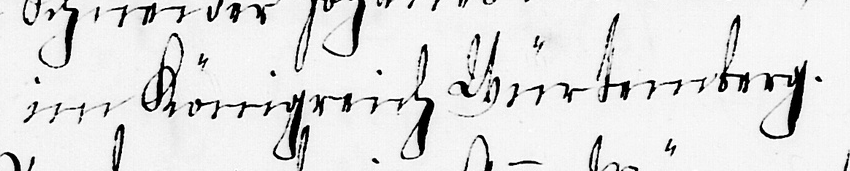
im Königreich Würtemberg.
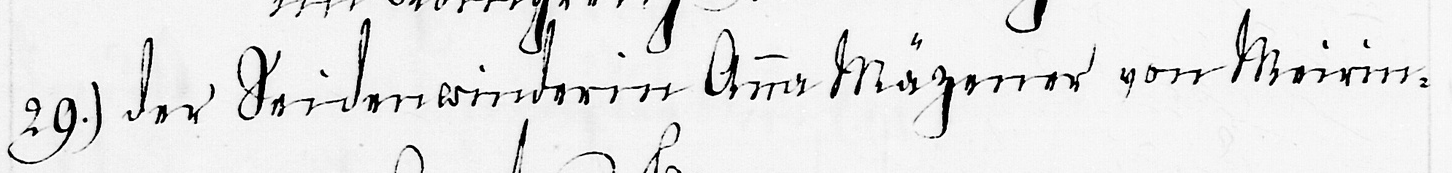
29.) der Seidenweberin Anna Mäzener von Meirin¬
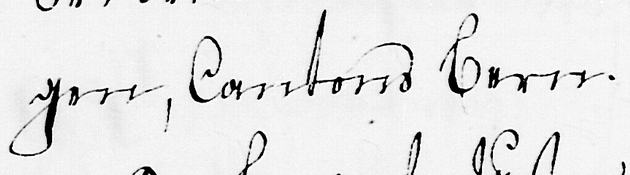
gen, Cantons Bern.
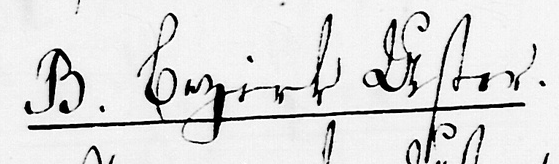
B. Bezirk Uster.
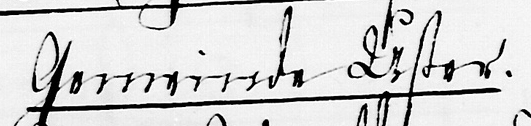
Gemeinde Uster.
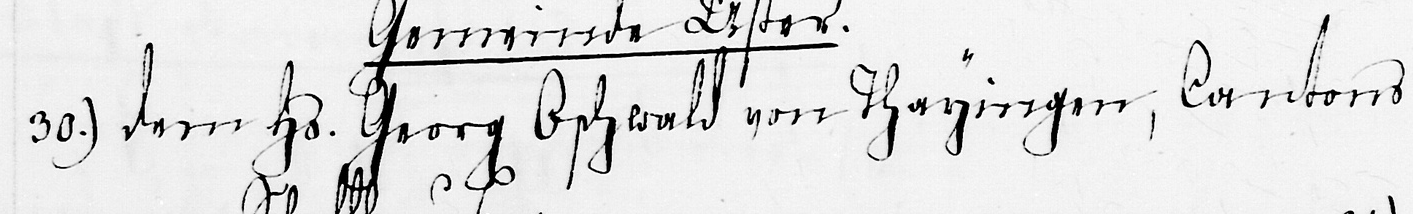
30.) dem Hs. Georg Oschwald von Thayingen, Cantons
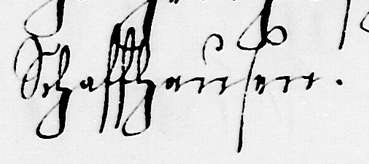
Schaffhausen.
